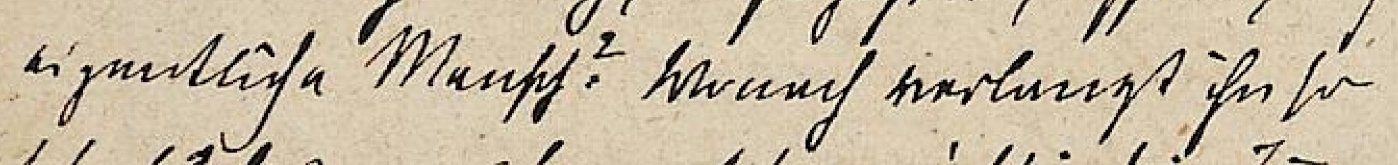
eigentliche Mensch? Wonach verlangt ihn so
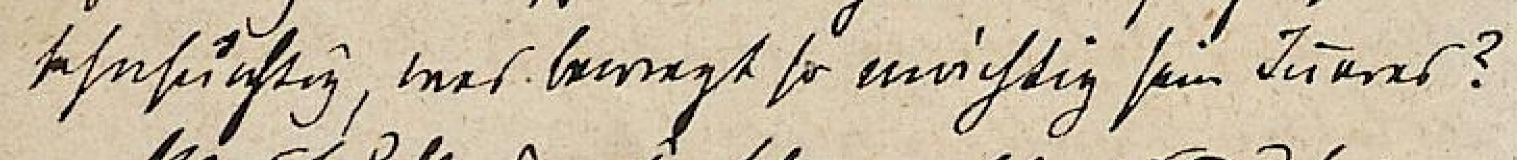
sehnsüchtig, was bewegt so möchtig sein Ineres?
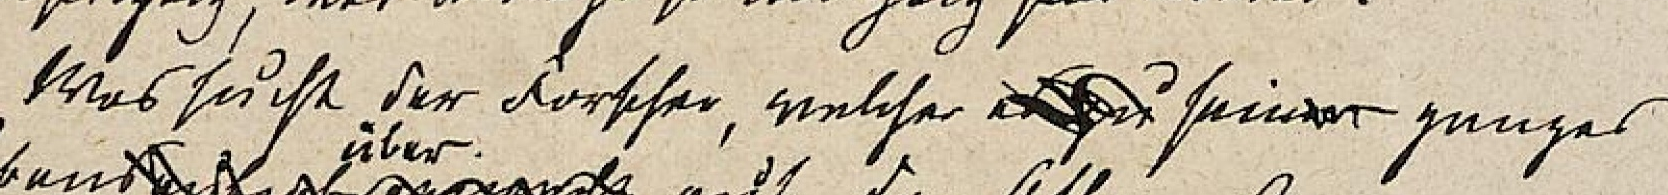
Was sucht der Forscher, welcher es zu seineer ganzes
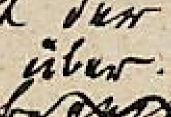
über
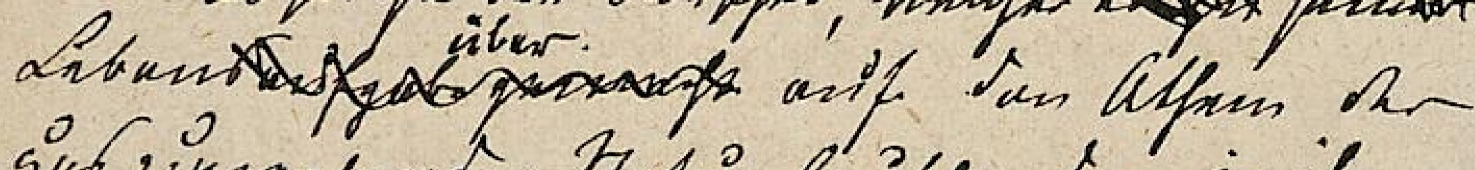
Lebensaufgabe gemacht auf den Athem der
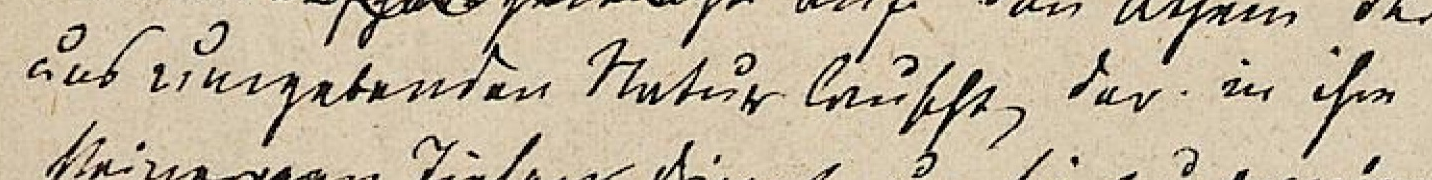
uns umgebenden Natur lauscht, der in ihre
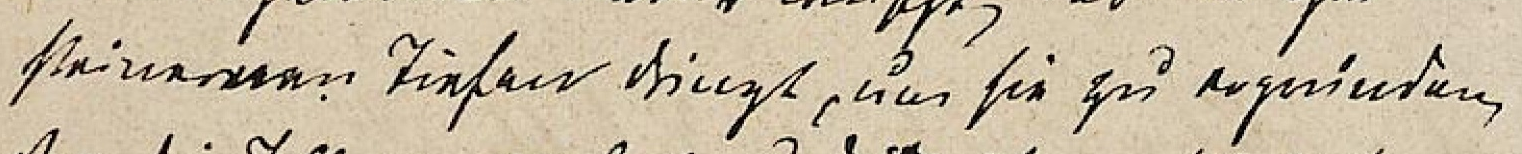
steinernen Tiefen dringt, um sie zu ergründen,
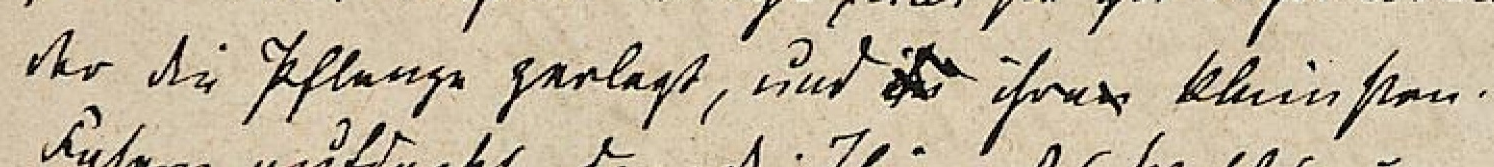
der die Pflanze zerlegt, und in ihre kleinsten
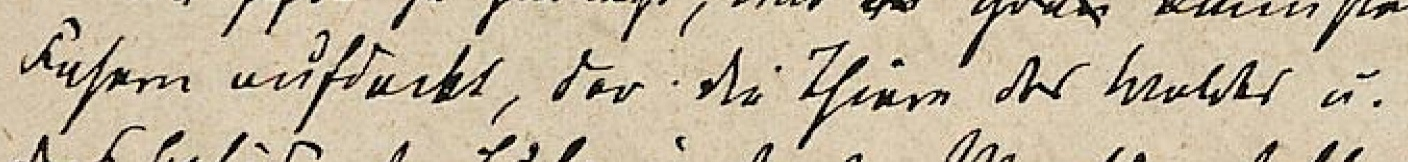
Fasern aufdeckt, der die Thiere des Waldes u.
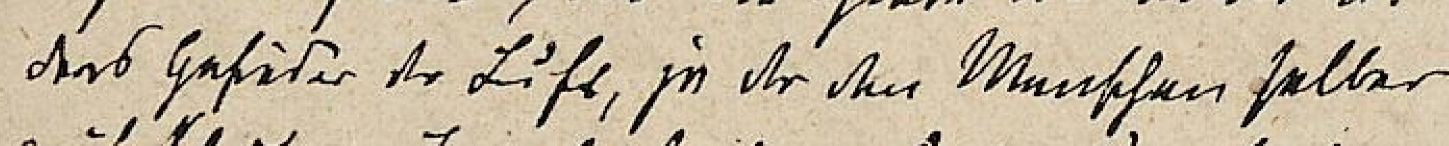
das Gefieder der Luft, ja dr den Menschen selber
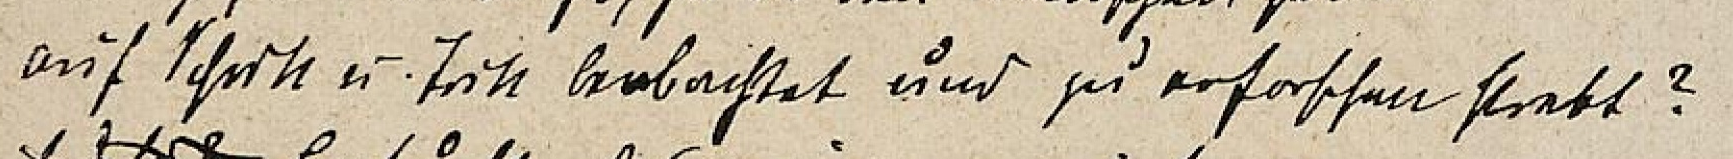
auf Schritt u Tritt beobachtet und zu erforschen strebt?
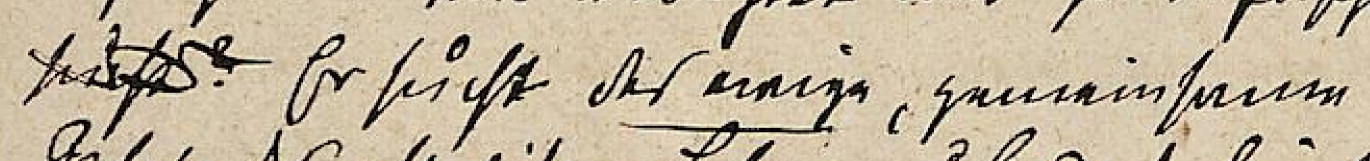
such? Er sucht das ewige, gemeinsame
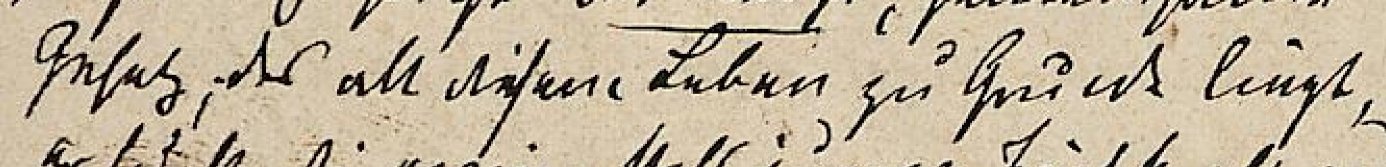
Gesetz; das all diesem Leben zu Grunde liegt,
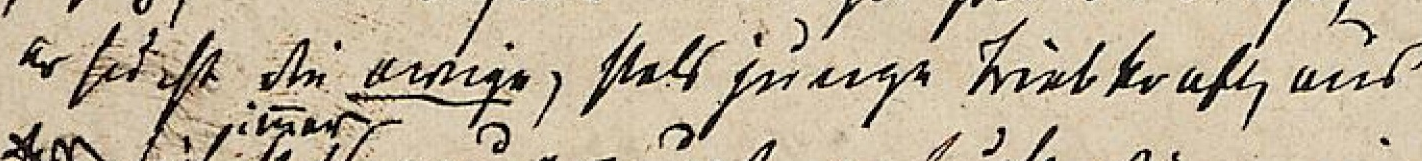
er sucht die ewige, stets junge Triebkraft, aus
